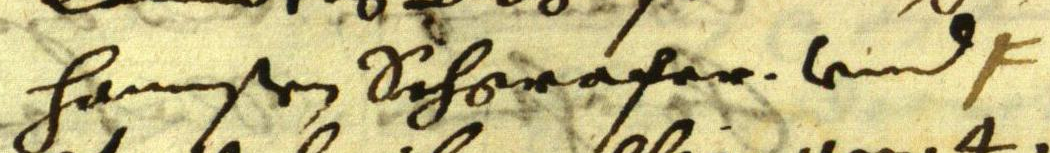hannsen Schgrafer. vnd
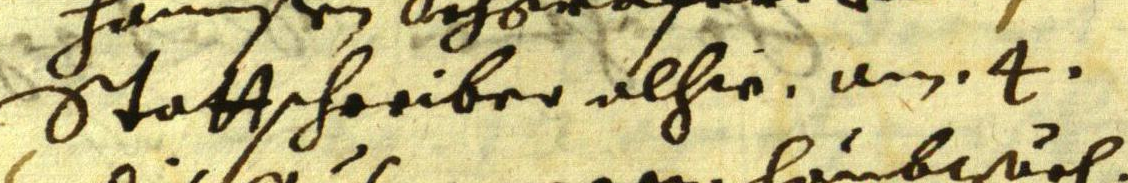Stattschreiber alhie. am .4.
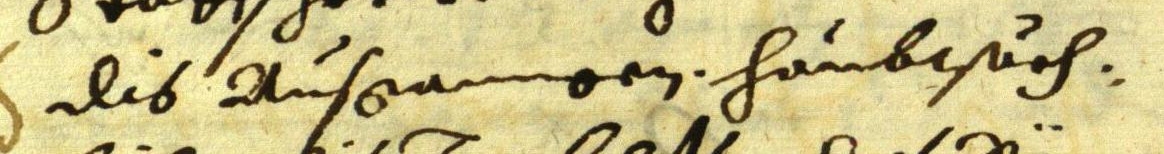dis Aūsganngen. haūbtsach¬
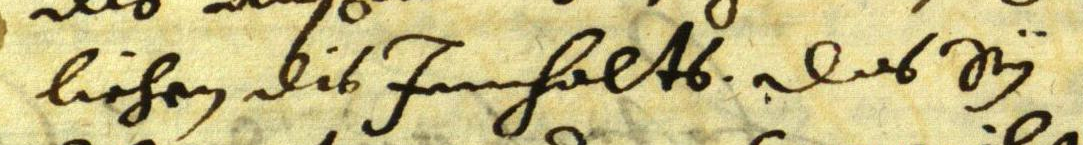lichen dis Innhalts. das Sÿ
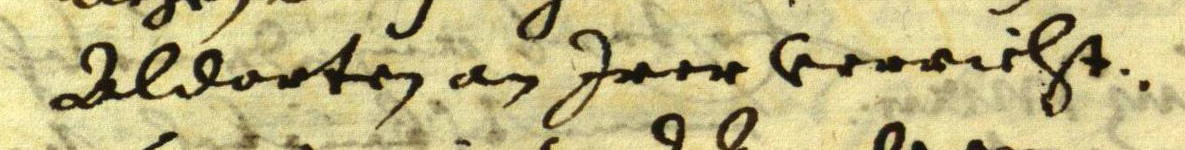Aldorten an Irer verricht¬
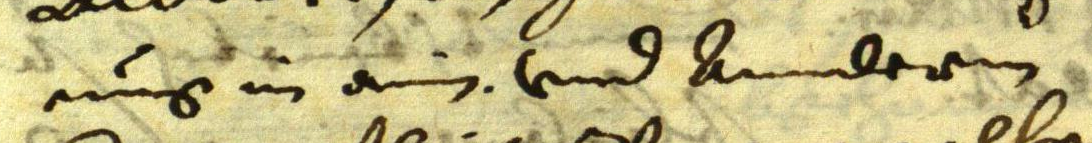ūng in ainen. vnd Annderm
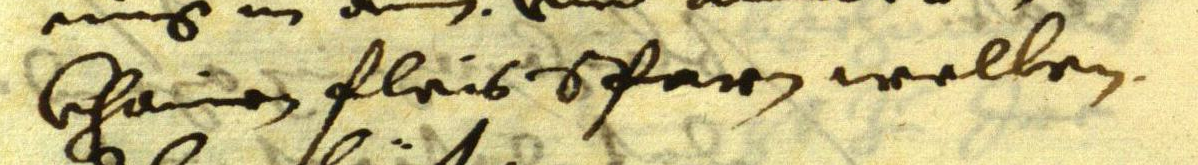khainen fleis Sparn wellen.
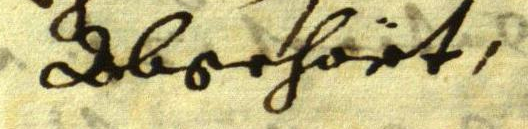Abgehört,
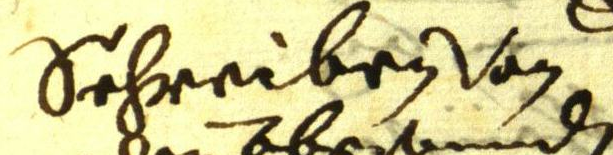Schreiben Von
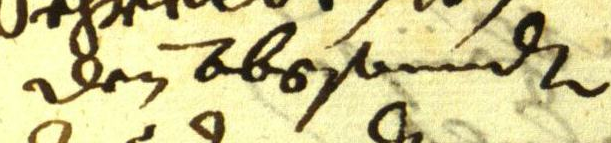den Abgsanndt
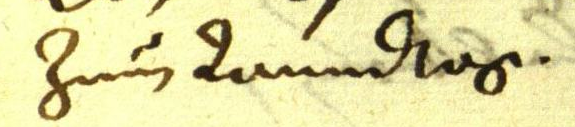Zūm Lanndtag.
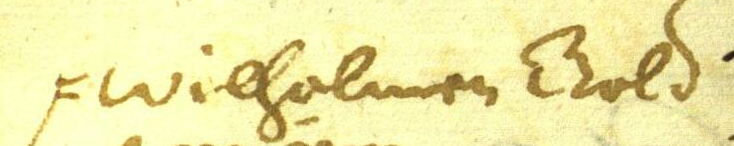Wilhalmen Gold¬
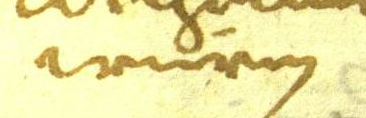wurm
